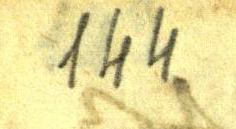144
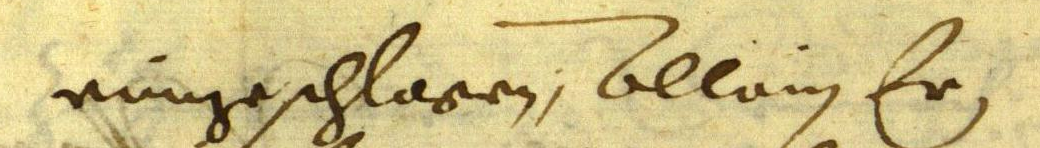einzeschlagen, Allain Er
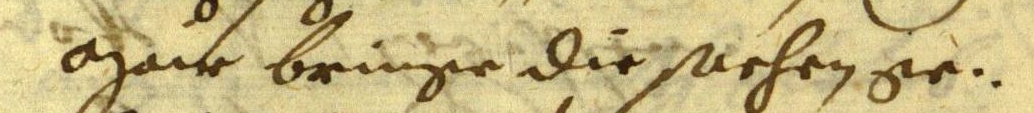Mair bringe die sachen ge¬
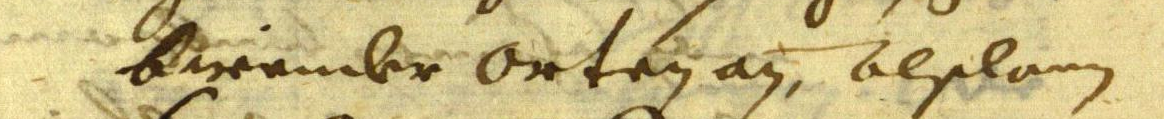birender orten an, Alsdann
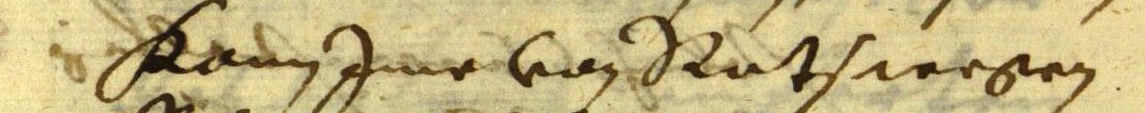Kann Ime von Ratswegen
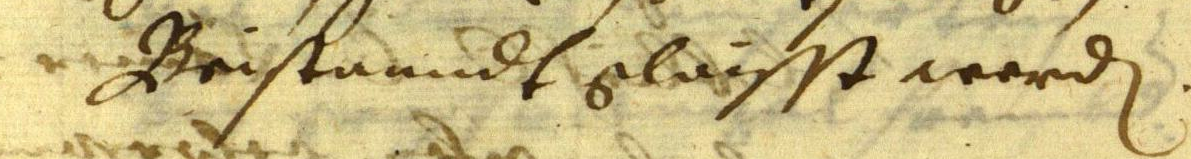Beistanndt glaisst werd.
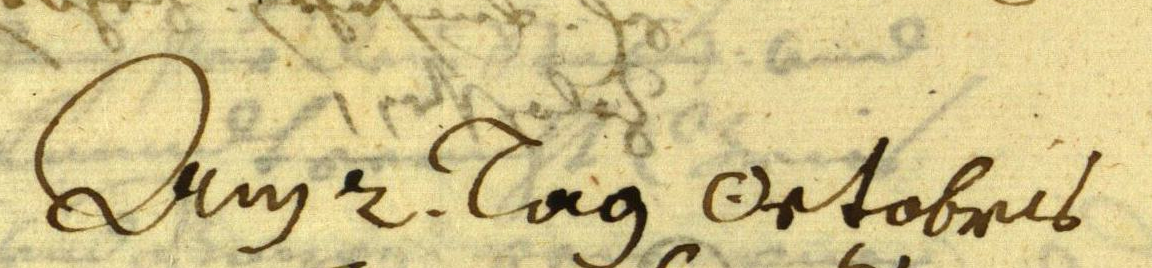Am 2. Tag Octobris
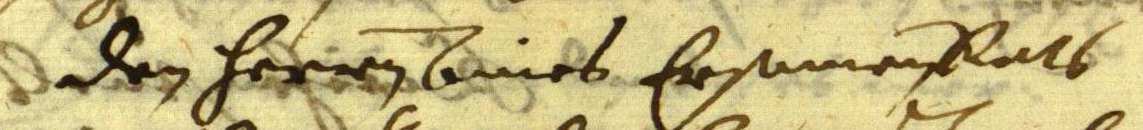den herrn Aines Ersamen Rats
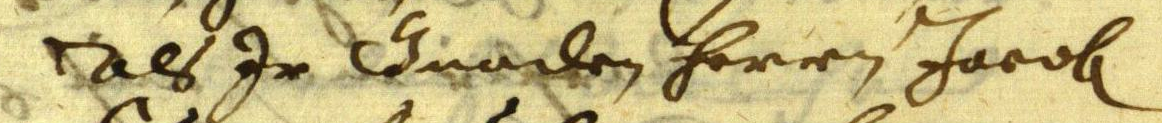Als Ir Gnaden herrn Jacob
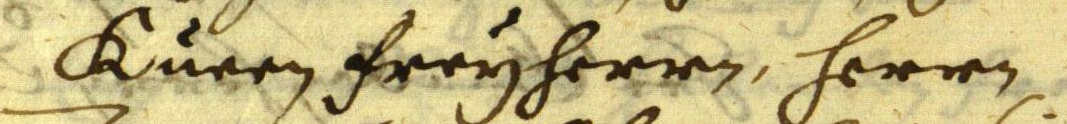Kūeen freȳherrn, herrn
